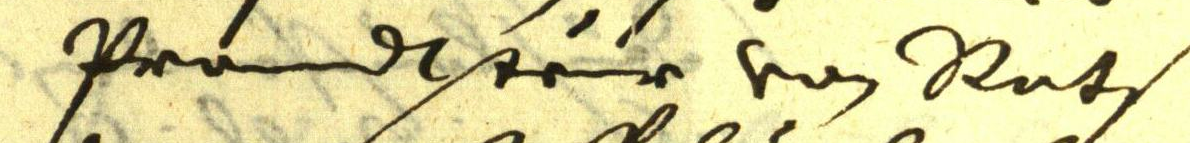Pranndtsteūr von Rats¬
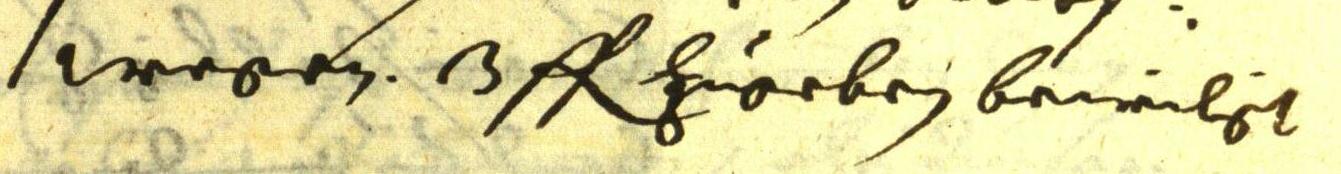wegen. 3 fl Zūgeben bewiligt
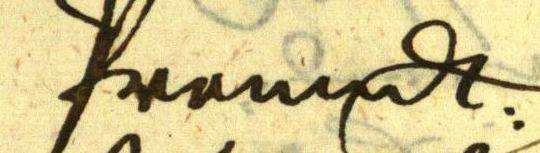Pranndt¬
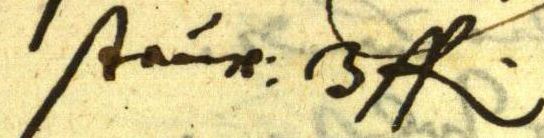steūr: 3 fl.
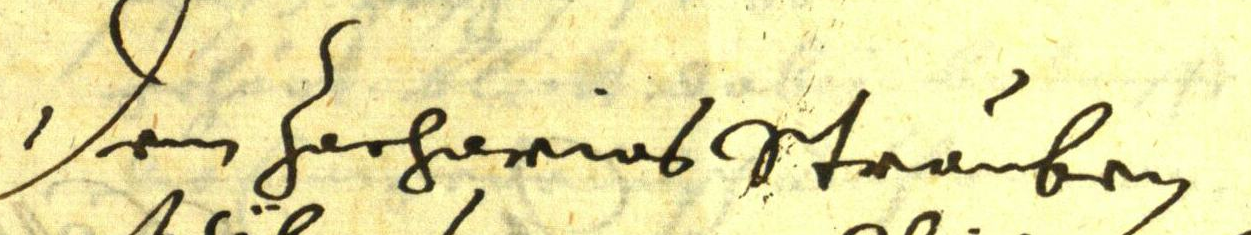Dem Zacharias Straūben
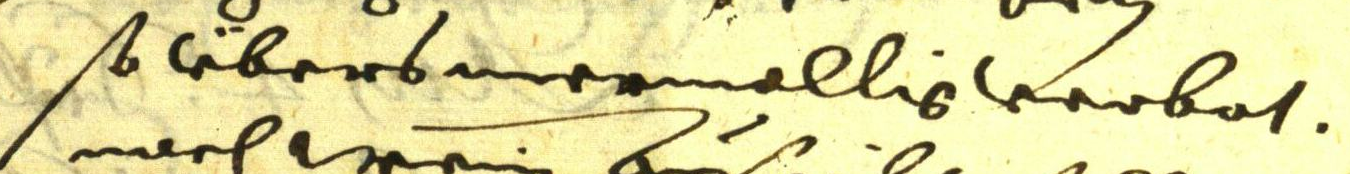So v̈bers mermallig verbot.
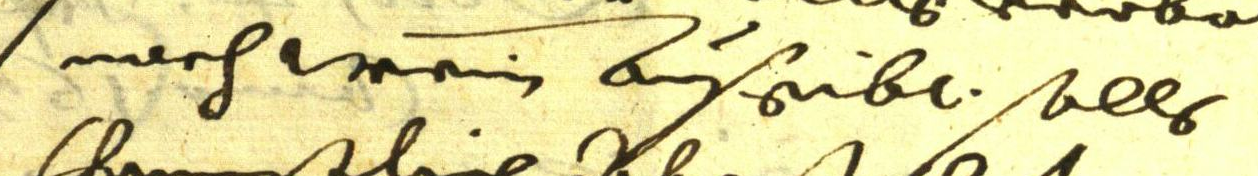noch wein Aūsgibt. solls
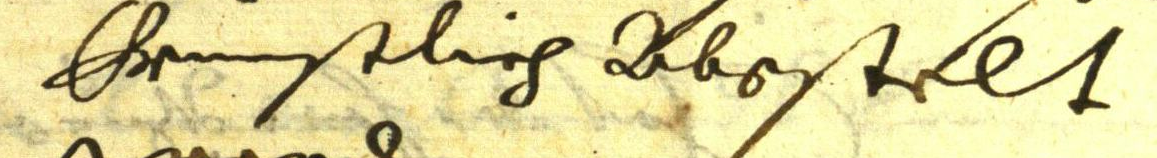Ernnstlich Abgstelt
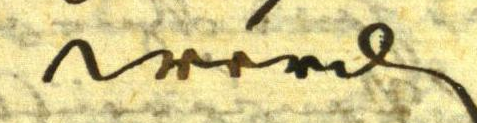werd.
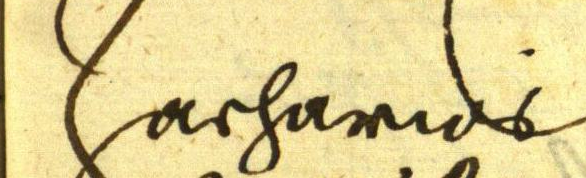Zacharias
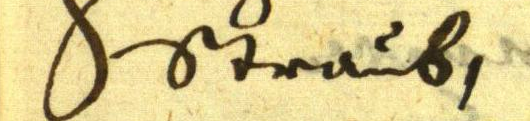Straūb,
